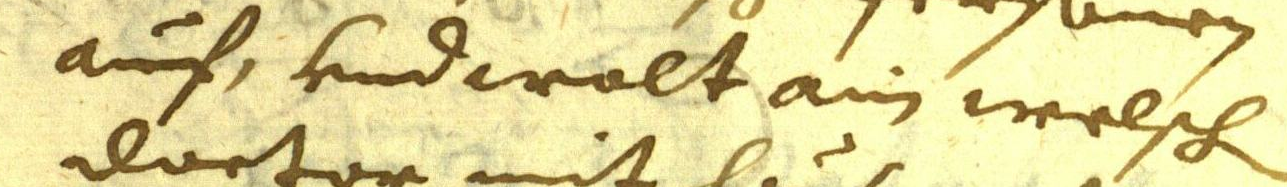aūf, vnd wolt ain welsch
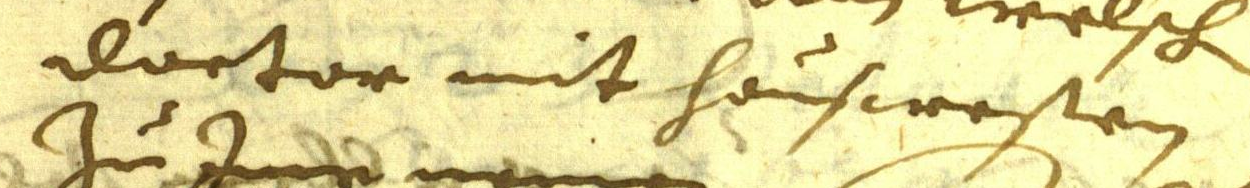doctor mit haūswesen
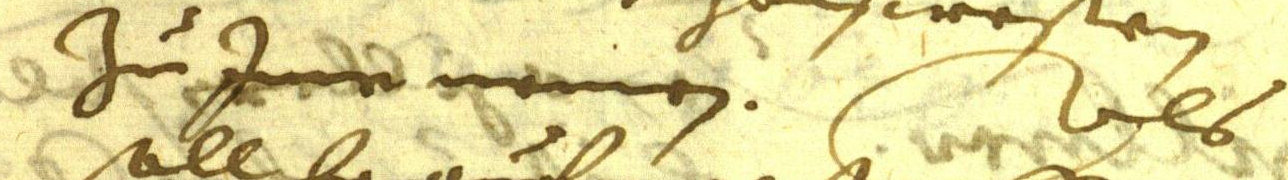Zū Ime nemen. Als
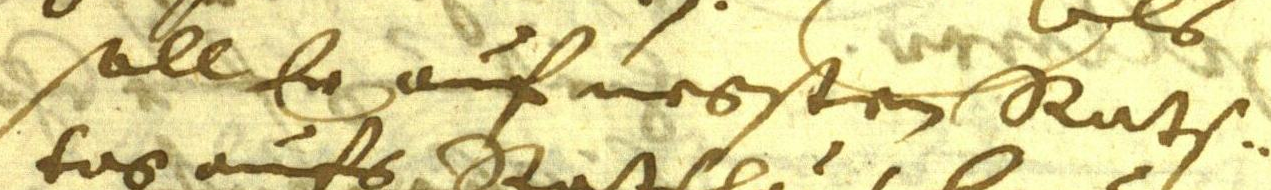soll Er aūf negsten Rats¬
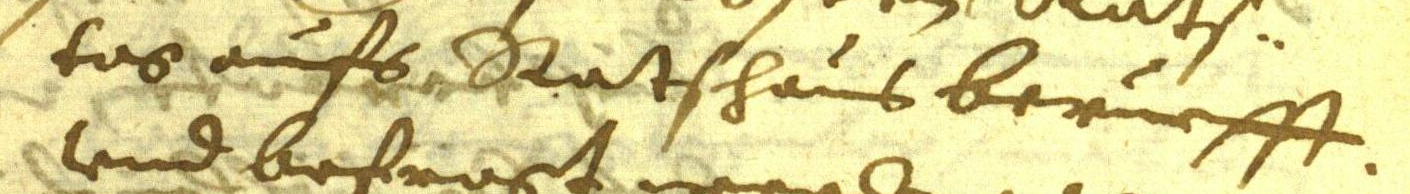tag aūfs Ratshaūs berūefft¬
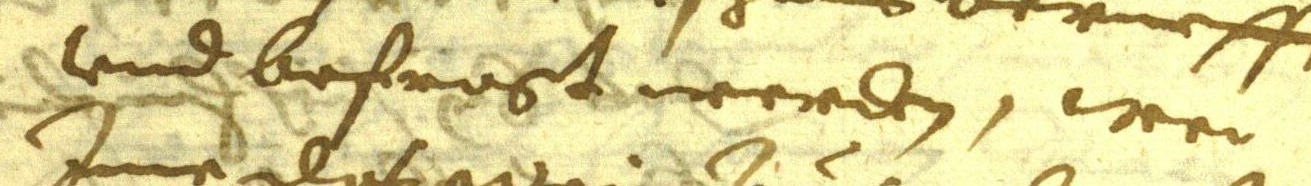vnd befragt weren, wer
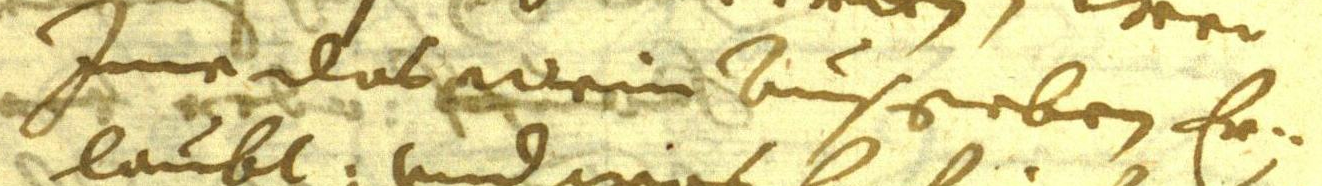Ime das wein Aūsgeben Er¬
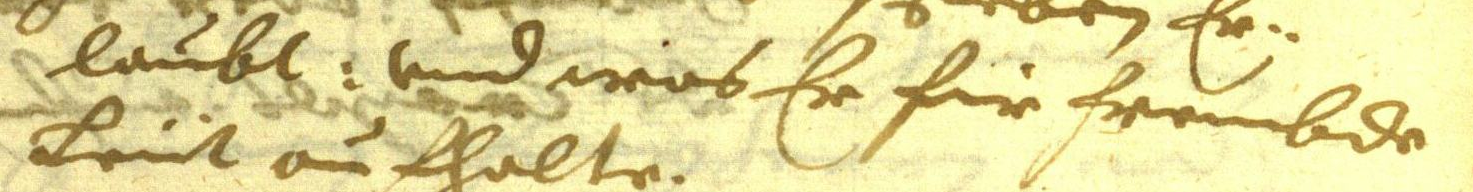laūbt: vnd was Er fir frembde
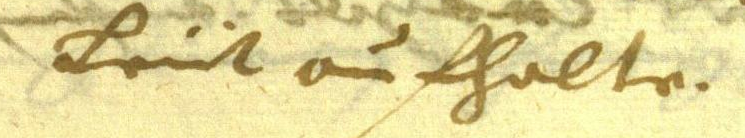Leüt aūfhalte.
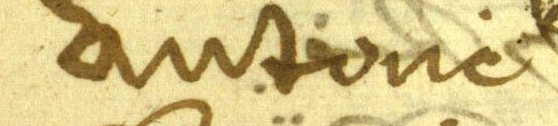Antoni
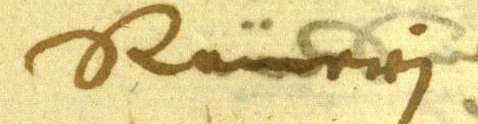Romerj
